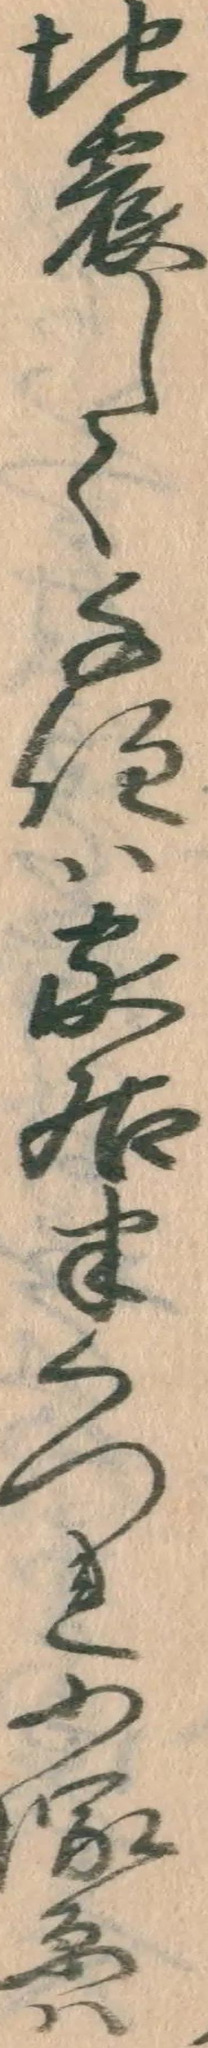地震して千住ハ家居半くつれ小塚原ハ
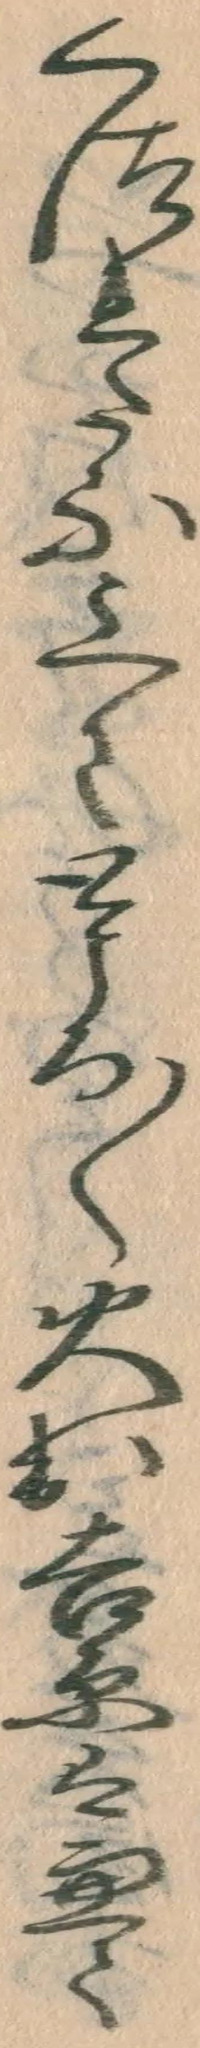くつれたる上にところ〳〵火出吉原は兼て
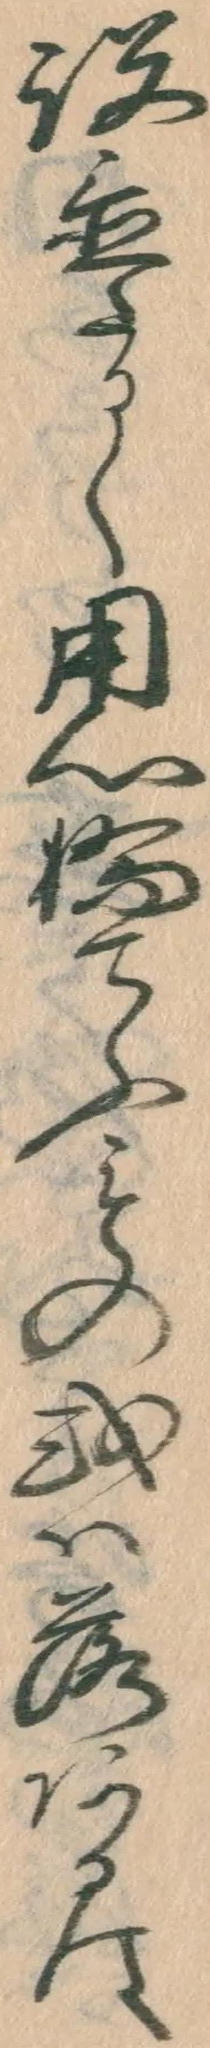役置たりし用心粉てふもの或ハ落あるは
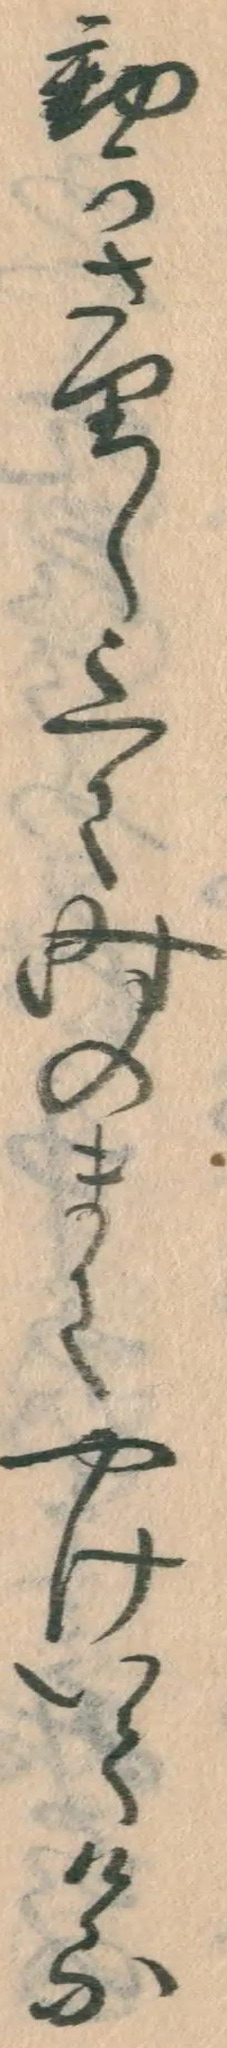動かさりし上に時のまにやけいてける
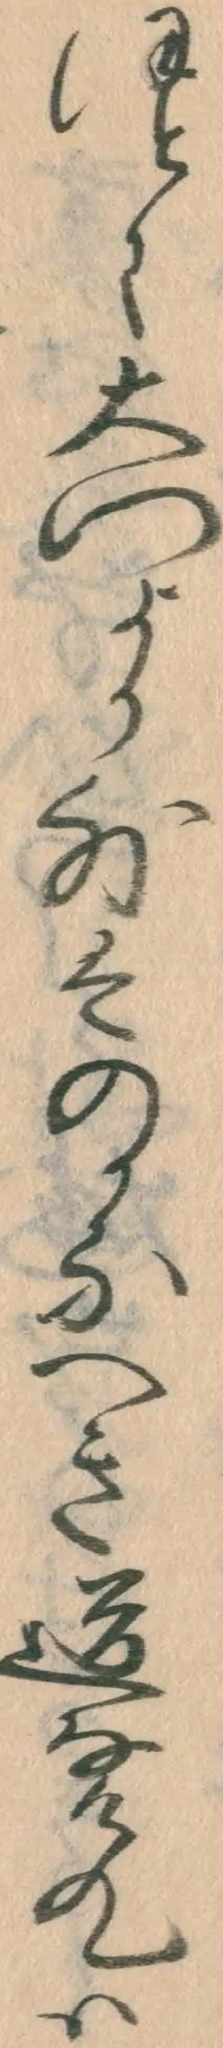ほとに大川より外はのかるへき道なけれハ
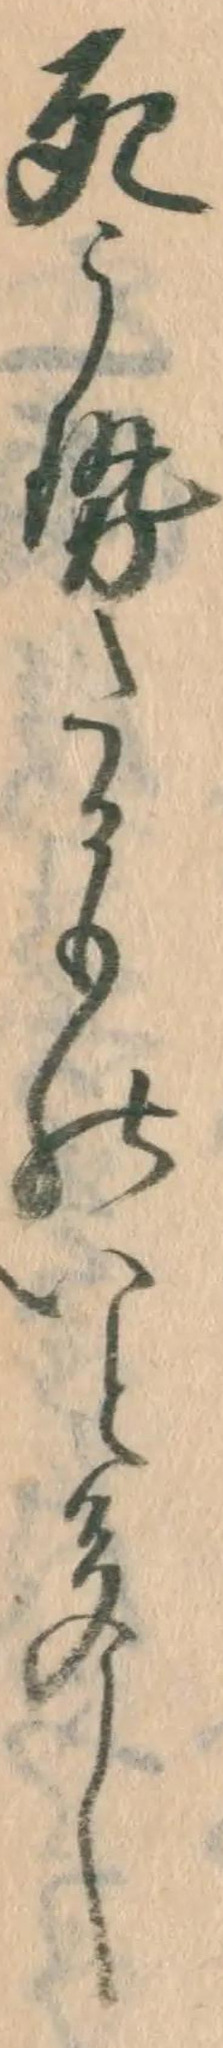死うせたるものいと多し

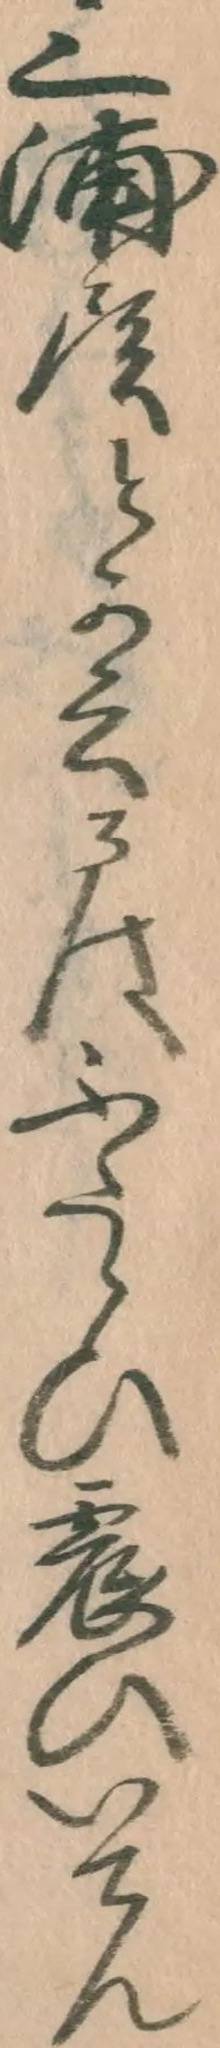三浦屋とか云にはふたヽひ震ひいてん
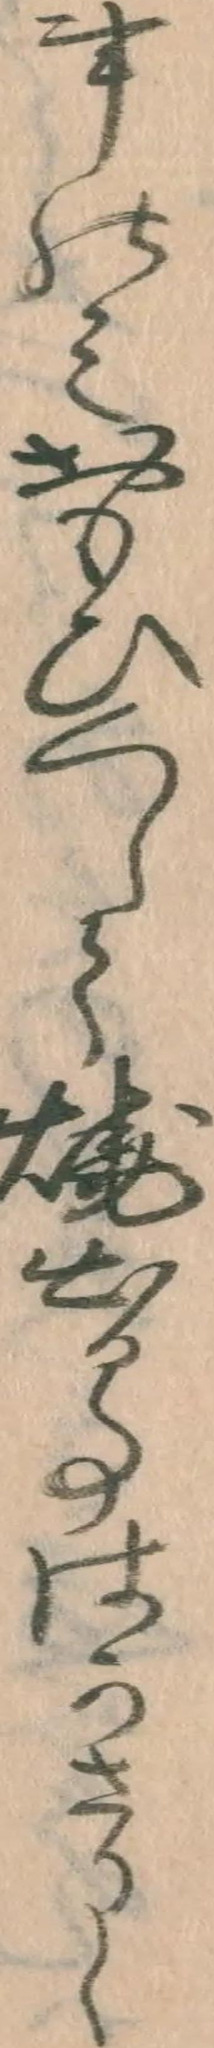事のミおもひくして燒出る事はかさりし
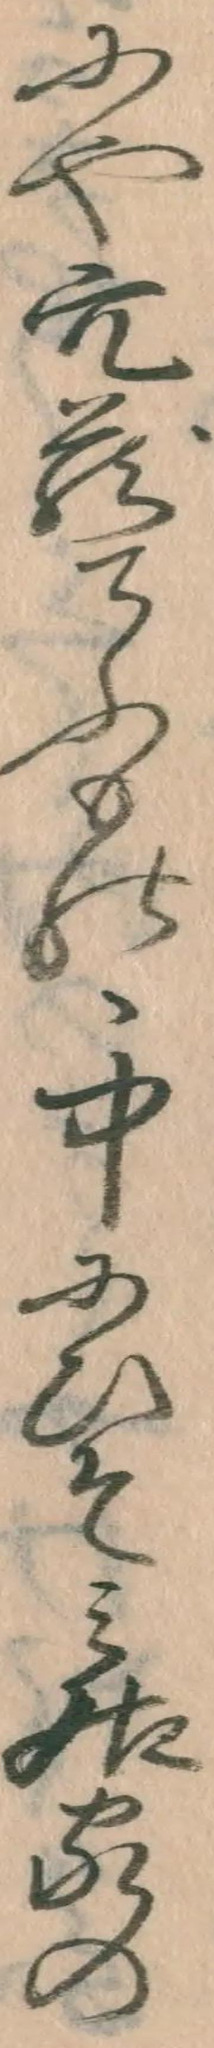にや穴蔵てふものゝ中にひそミ居家の
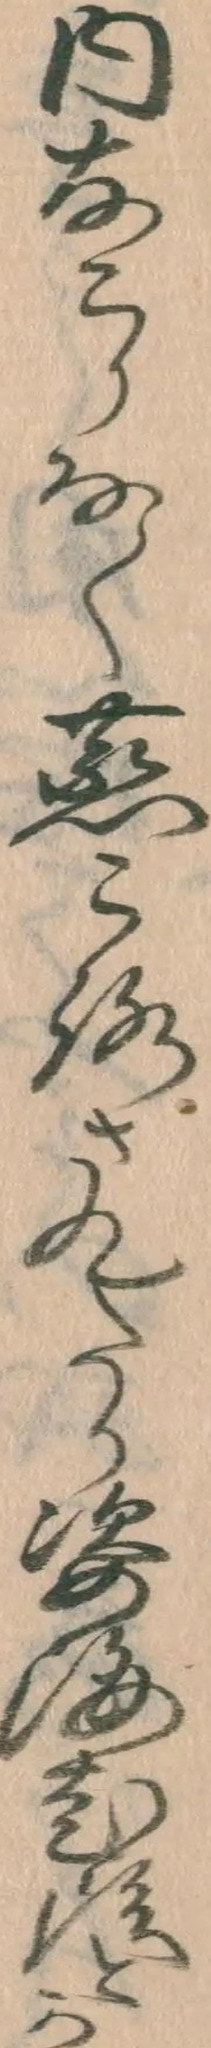内なこりなく蒸ころされたり姿海老屋とか
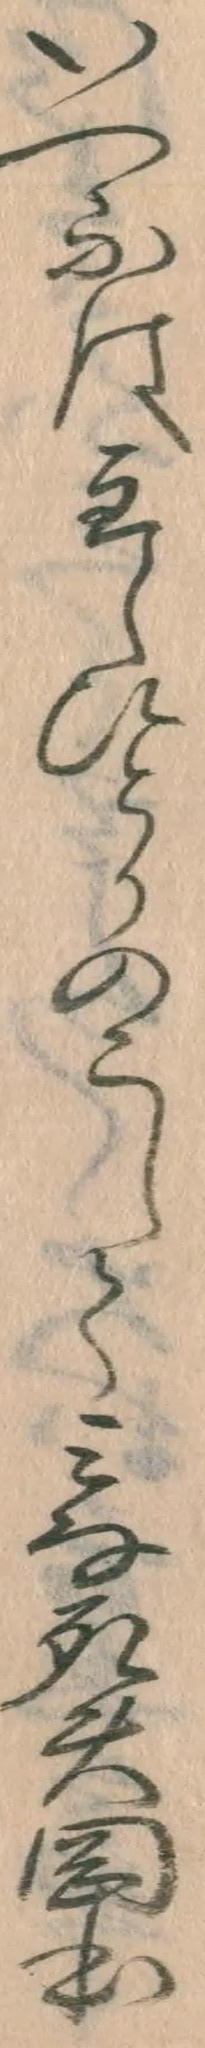いへるは主しひとりのこしてミな死失岡本
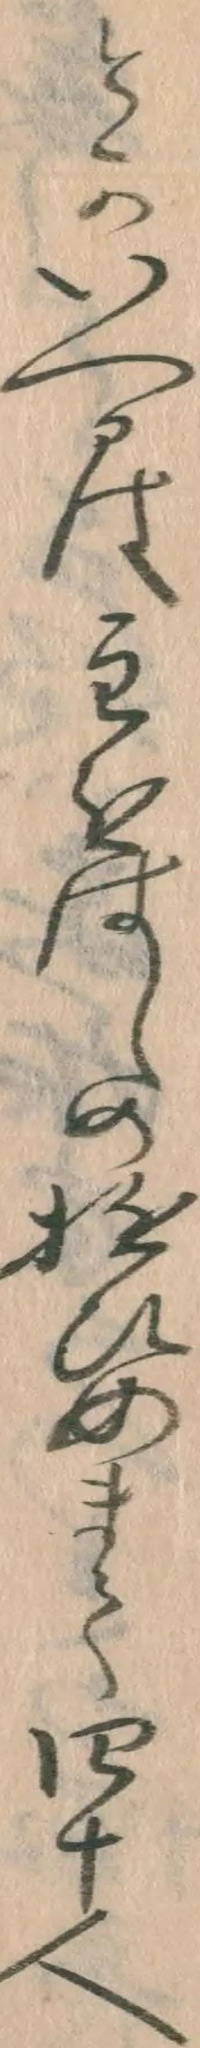とかいへるは主をはしめ遊ひめまて四十人
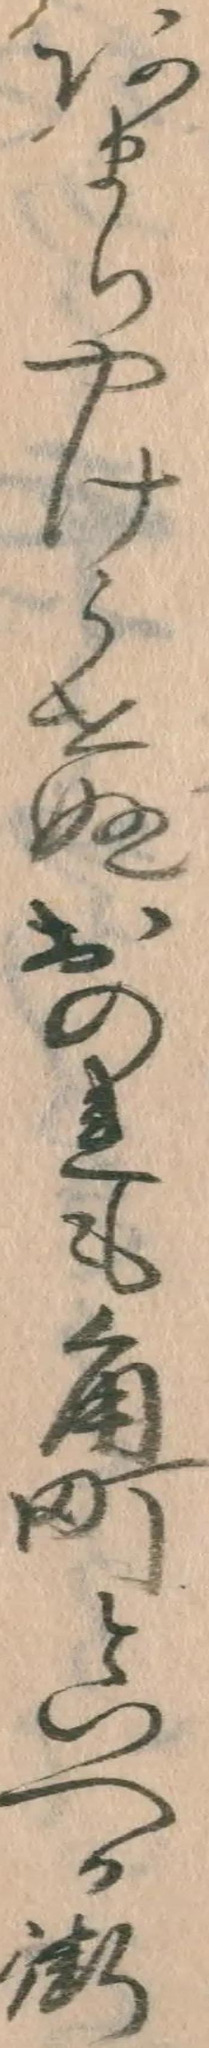あまりやけうせぬおのれも角町といへる街
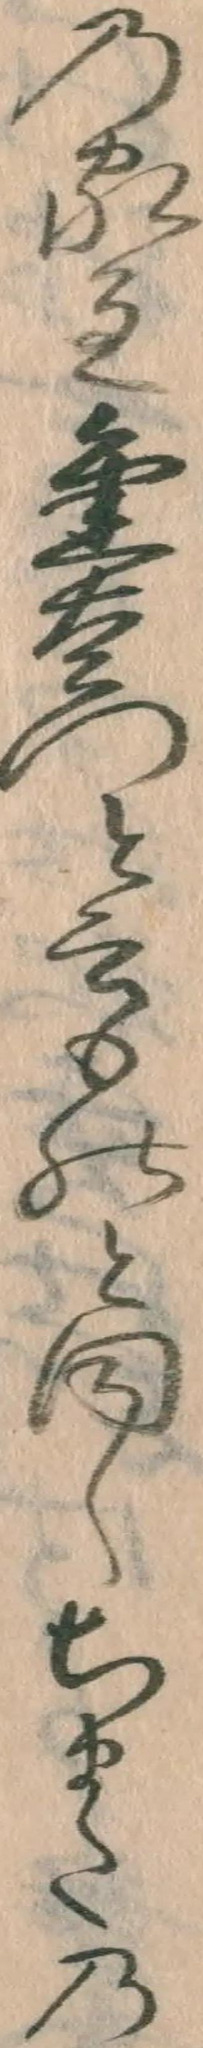の家主金右衛門と云ものと同しちまたの
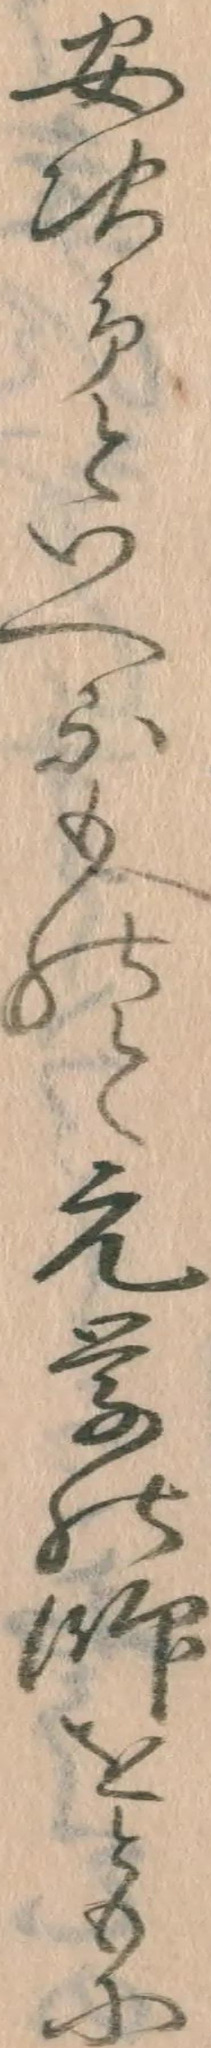安次郎といへるものと元学の師をともに
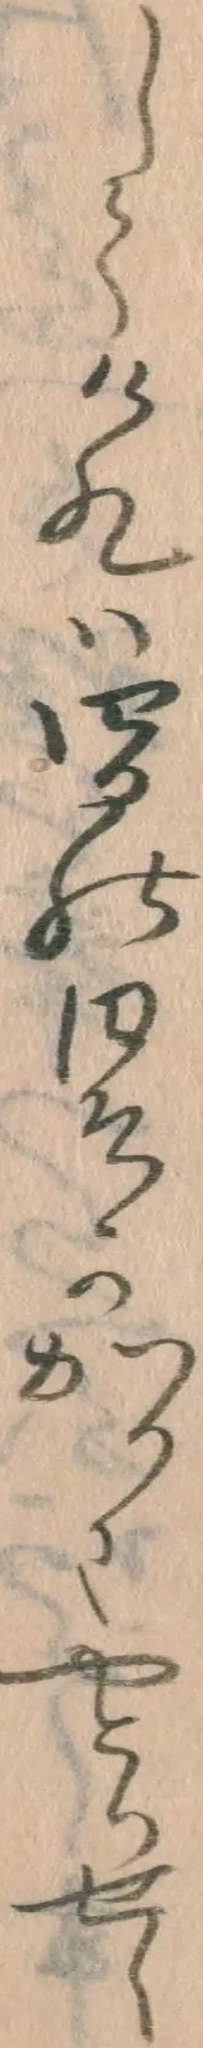してけれハ四日の日そかかりにやとりせし
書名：麗斎叢書. 20
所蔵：国立国会図書館 National Diet Library, JAPAN
